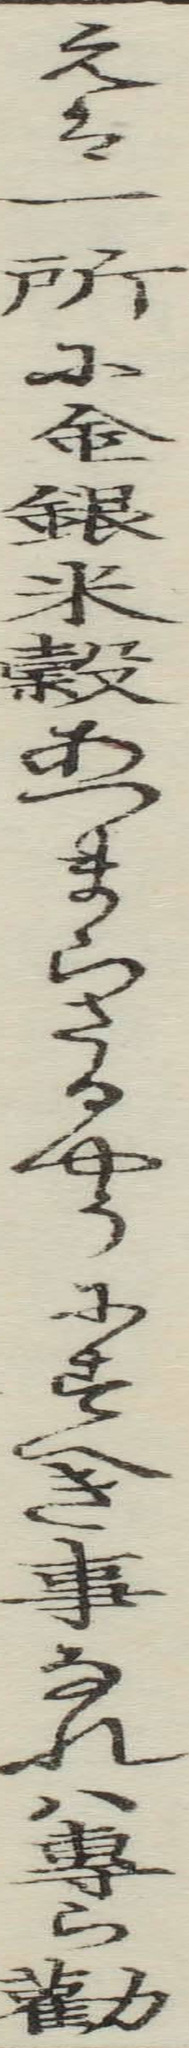えは一所に金銀米穀あつまらさるやうにすへき事なれは専ら勧
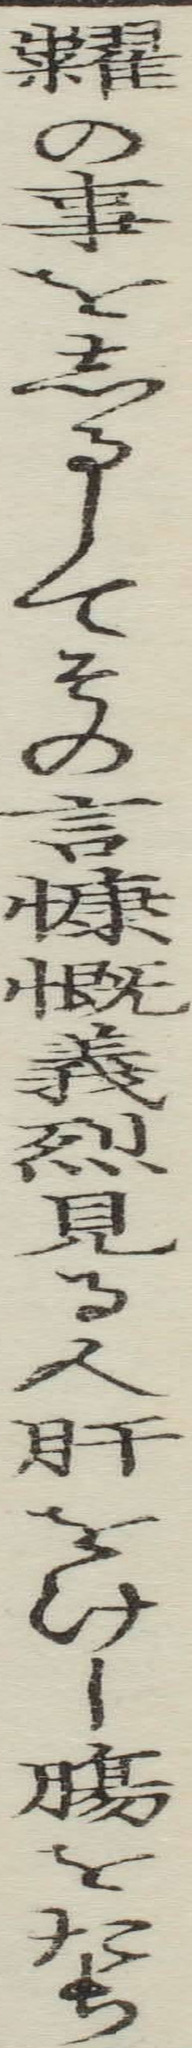糶の事をしるしてその言慷慨義烈見る人肝をけし腸をたち
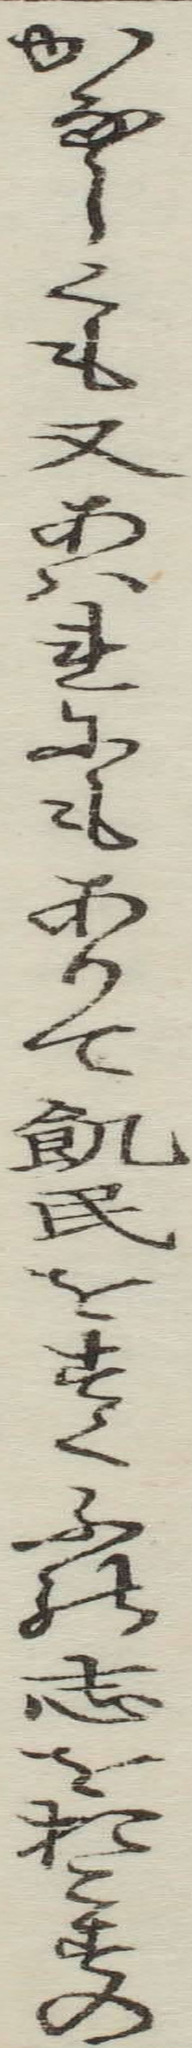かなしくも又あはれにもありて飢民をすくふの志をおこすの
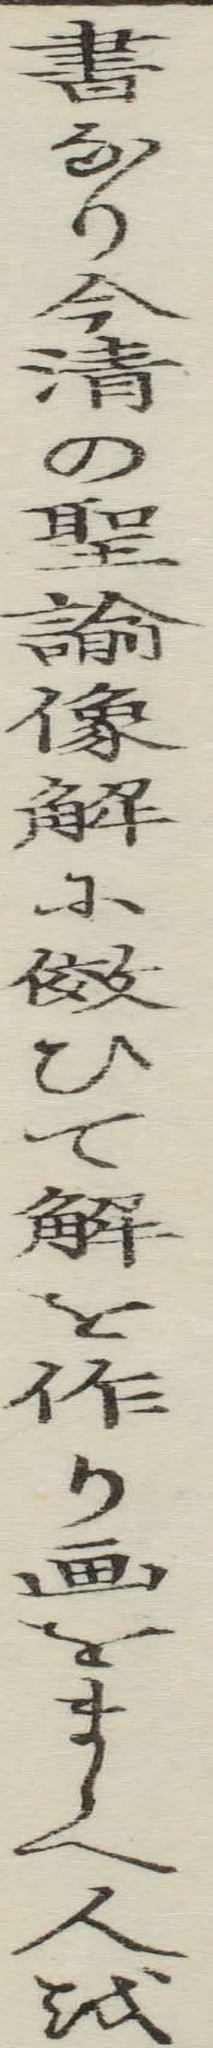書なり今清の聖諭像解に傚ひて解を作り画をましへ人を
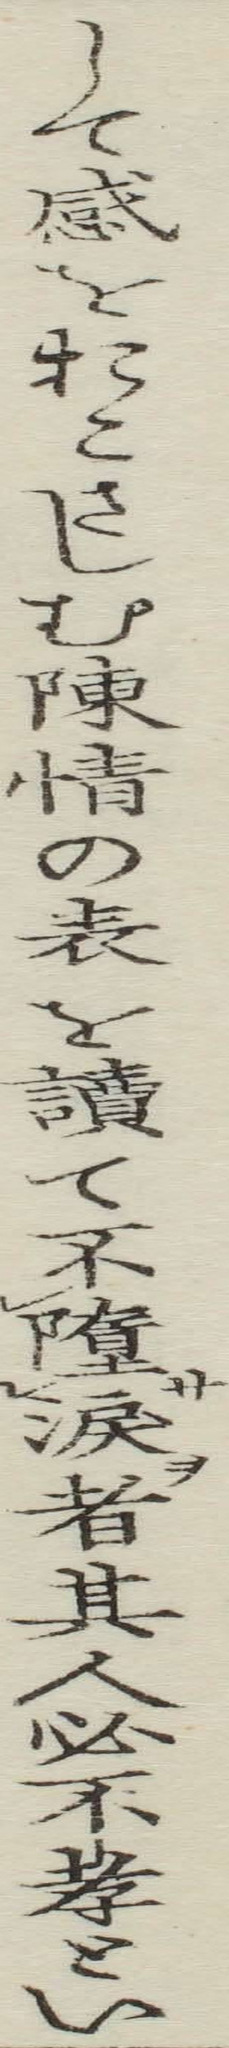して感をおこさしむ陳情の表を読て不墮涙者其人必不孝とい
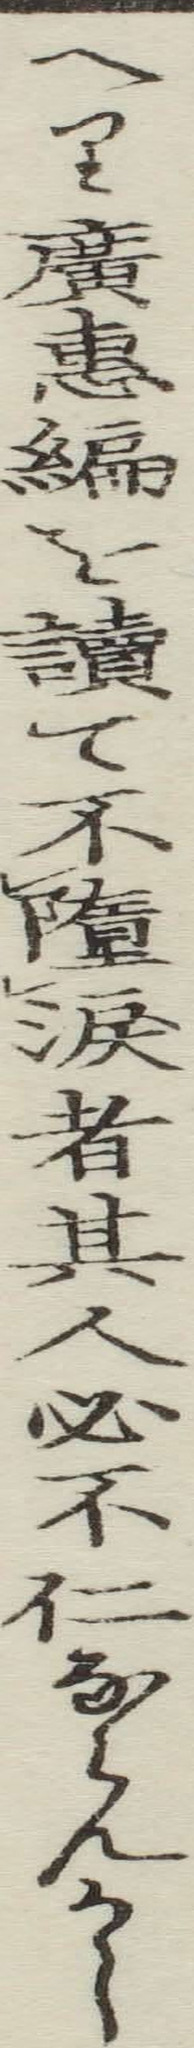へり広恵編を読て不墮涙者其人必不仁ならんかし
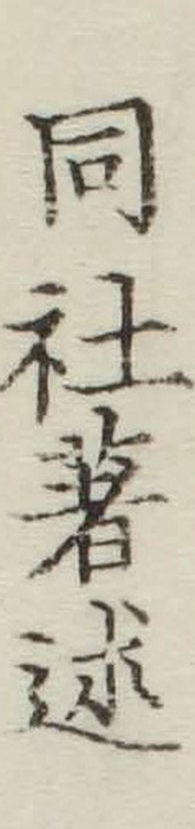同社著述
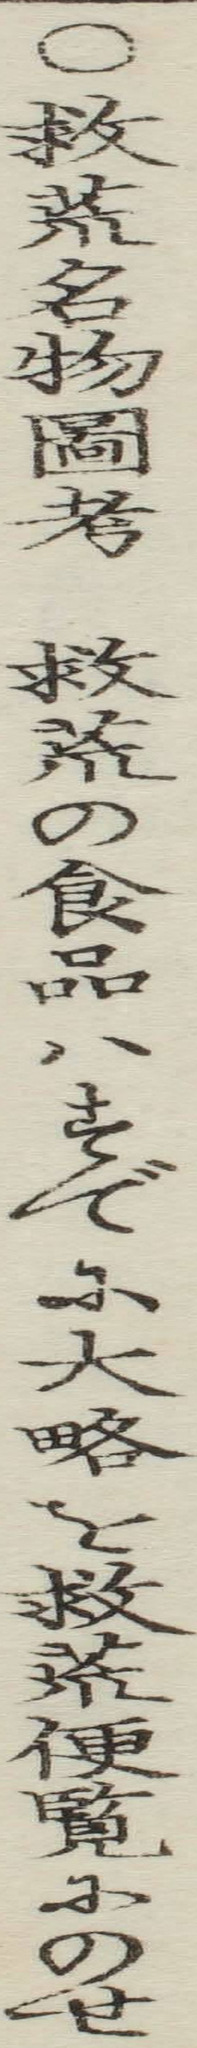○救荒名物図考救荒の食品はすでに大略を救荒便覧にのせ
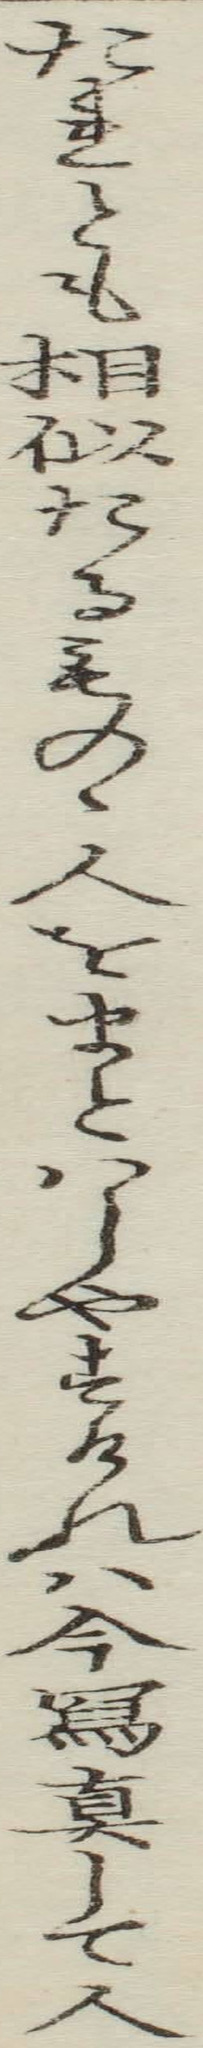たれとも相似たるものゝ人をまとはしやすけれは今写真して人
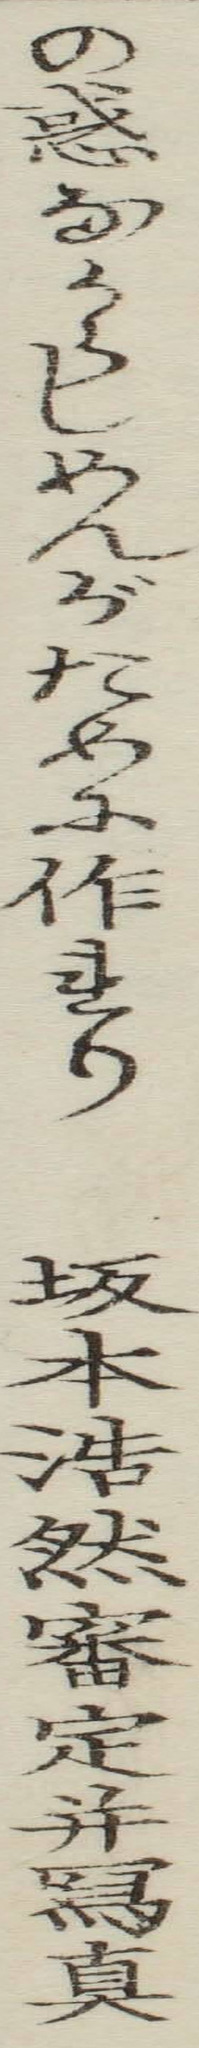の惑なからしめんがために作れり坂本浩然審定并写真

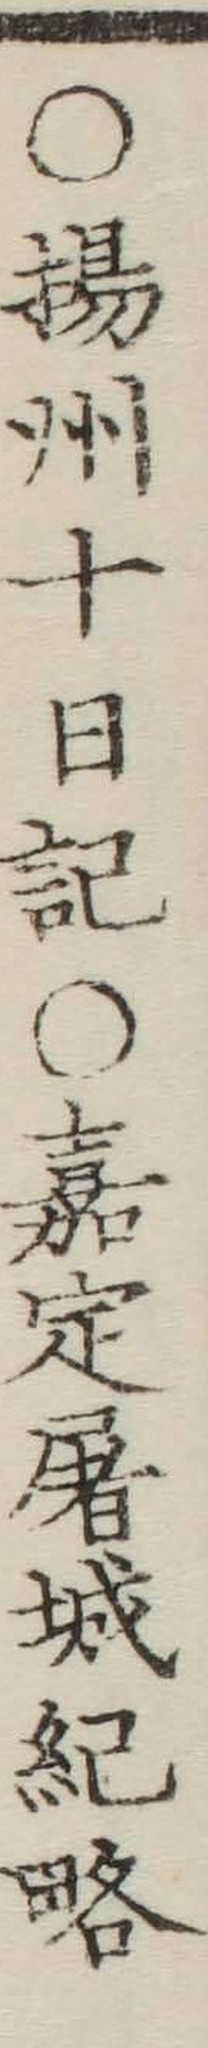○揚州十日記○嘉定屠城紀略
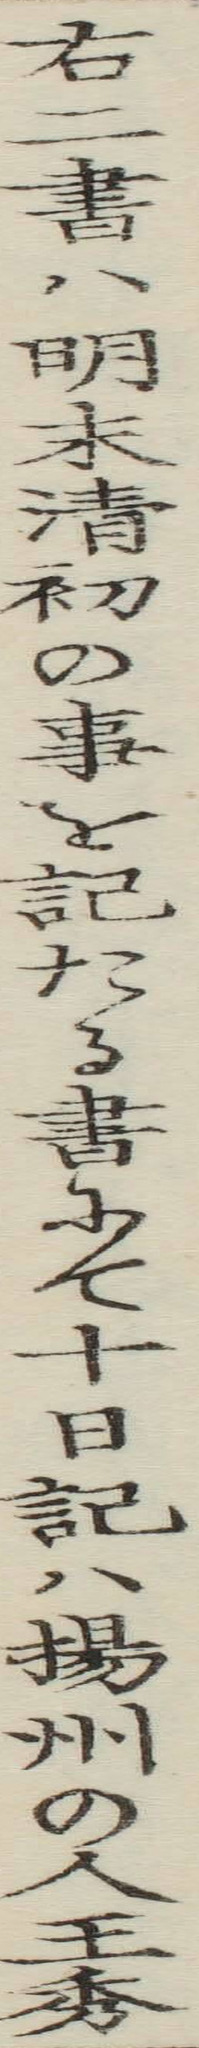右二書は明末清初の事を記たる書にて十日記は揚州の人王秀
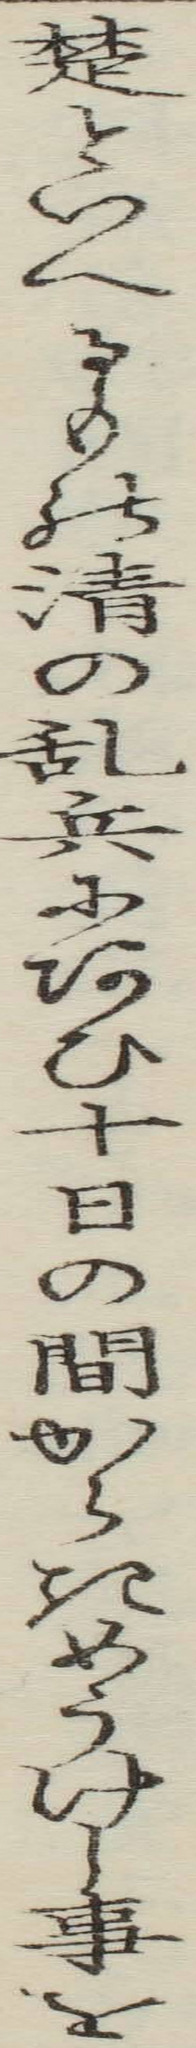楚といへるもの清の乱兵にあひ十日の間からきめうけし事を
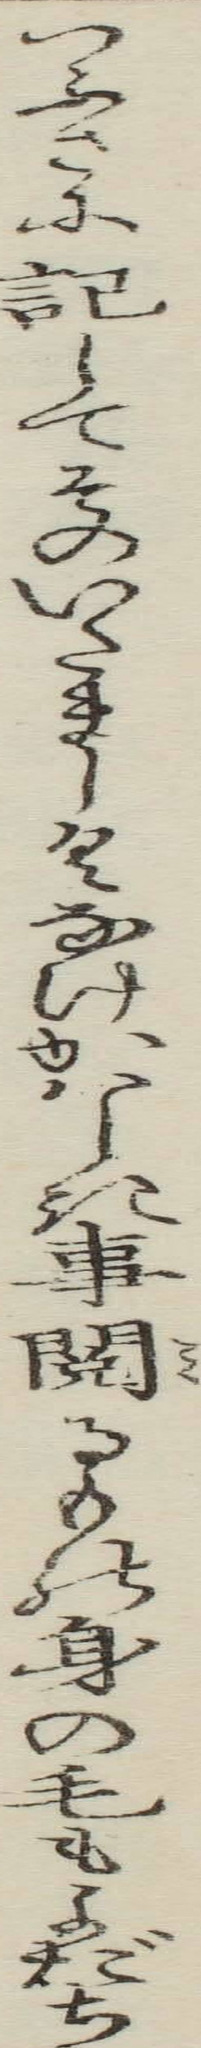つふさに記してそのいたましくなけかはしき事閲るもの身の毛もよだち
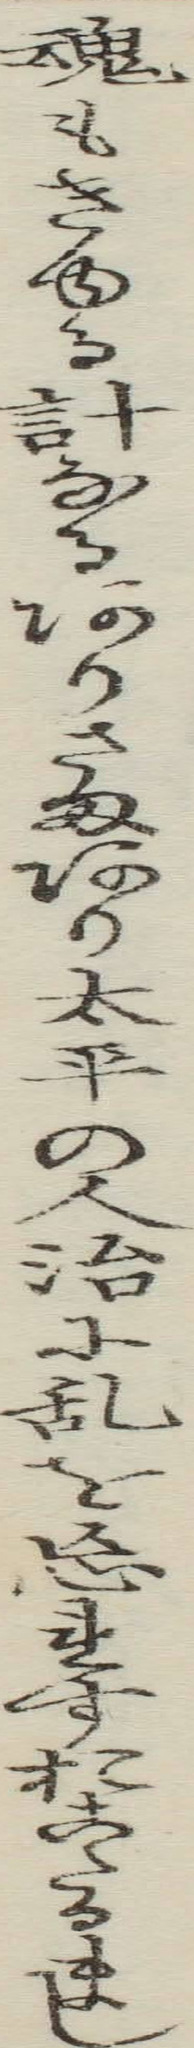魂もきゆる計なるありさまあり太平の人治に乱を忘れすおこたるまし
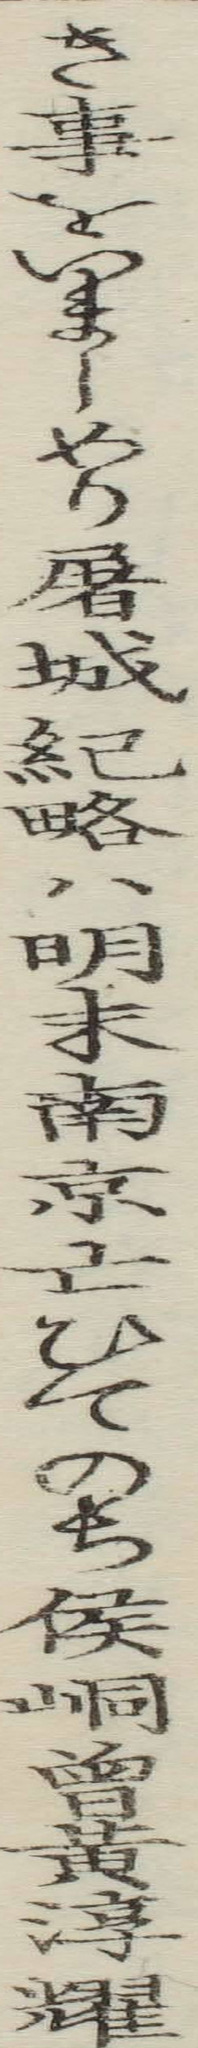き事をいましめり屠城紀略は明末南京亡ひてのち侯峒曽黄淳耀
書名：救荒便覧
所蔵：国文学研究資料館
